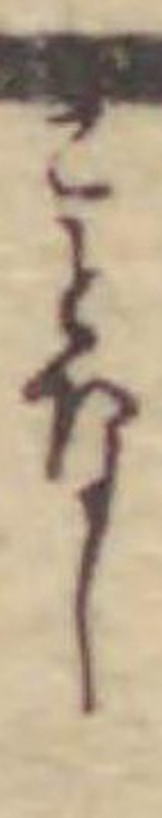ことなし
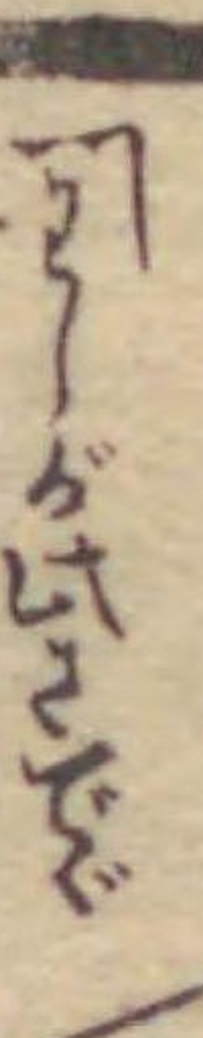〽わしが此さでゞ
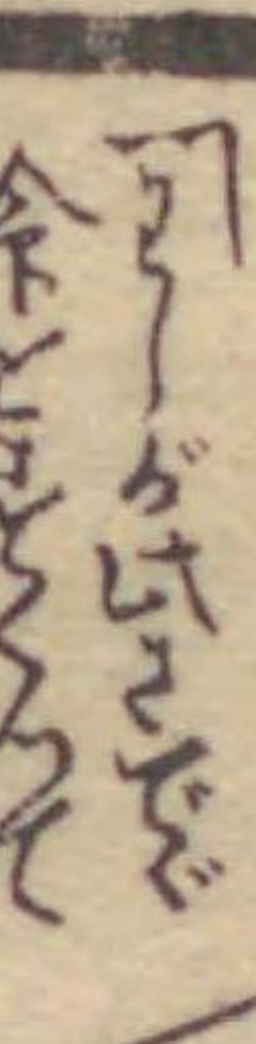命をすくつて
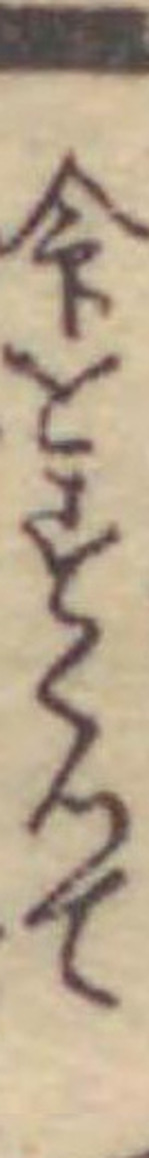命をすくつて
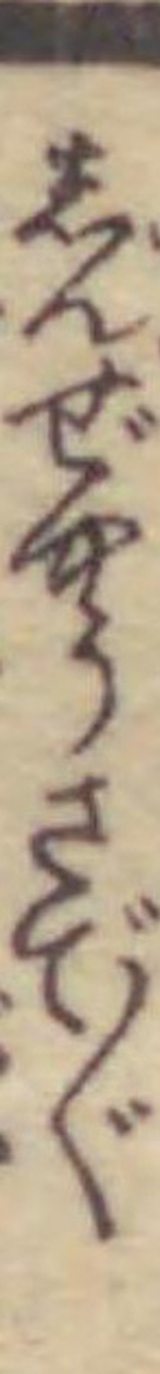しんぜやうさで〴〵
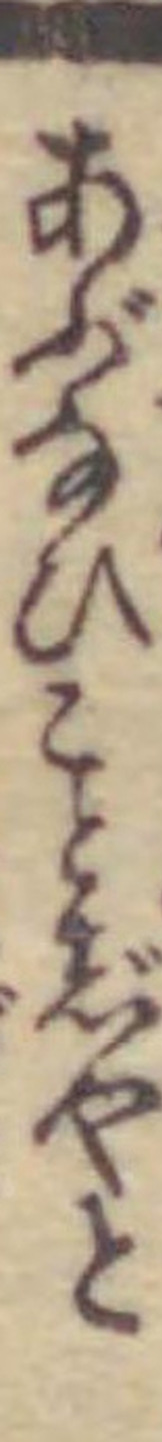あぶなひことじやと
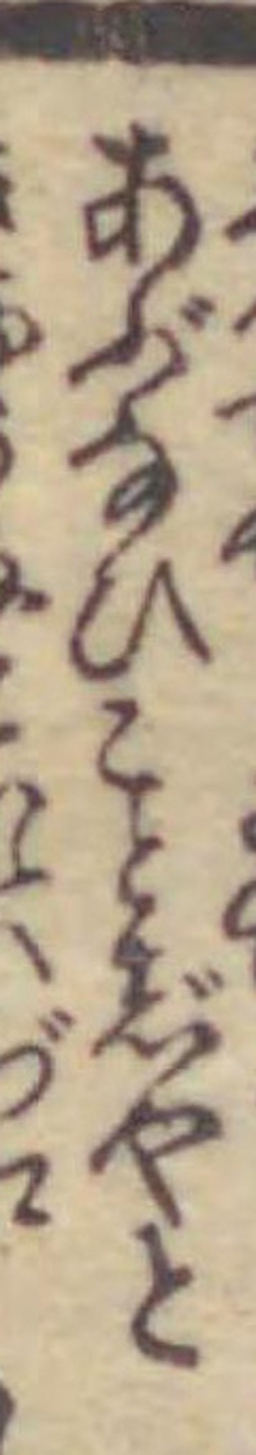あぶなひことじやと
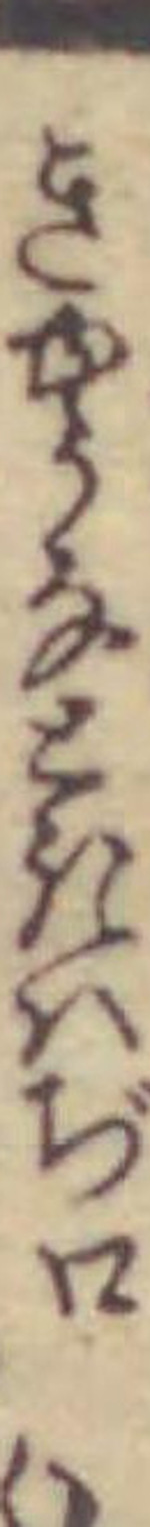きやうなときはぢ口
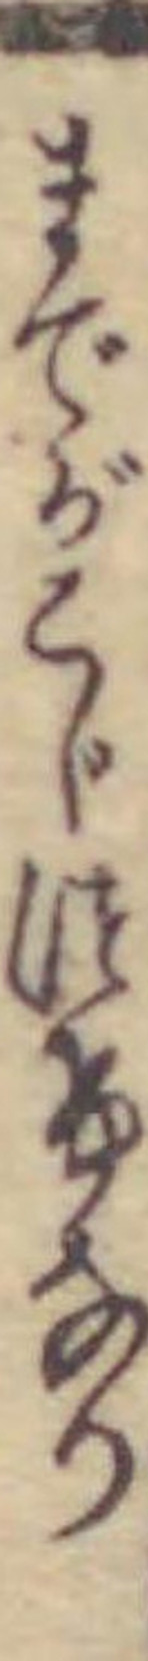までがこじつけなり
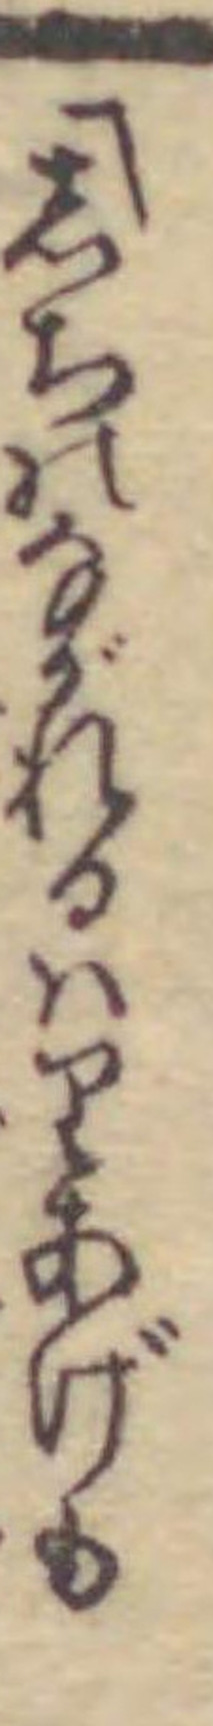〽しちのながれるはりあげも
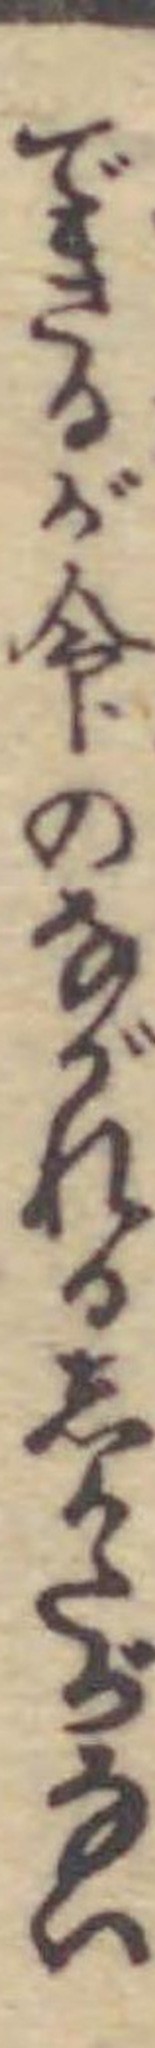できるが命のながれるしかたがない
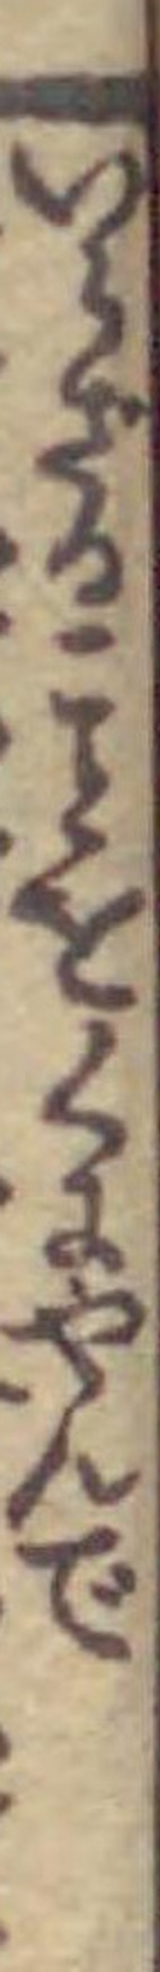いらざることをくにやんで
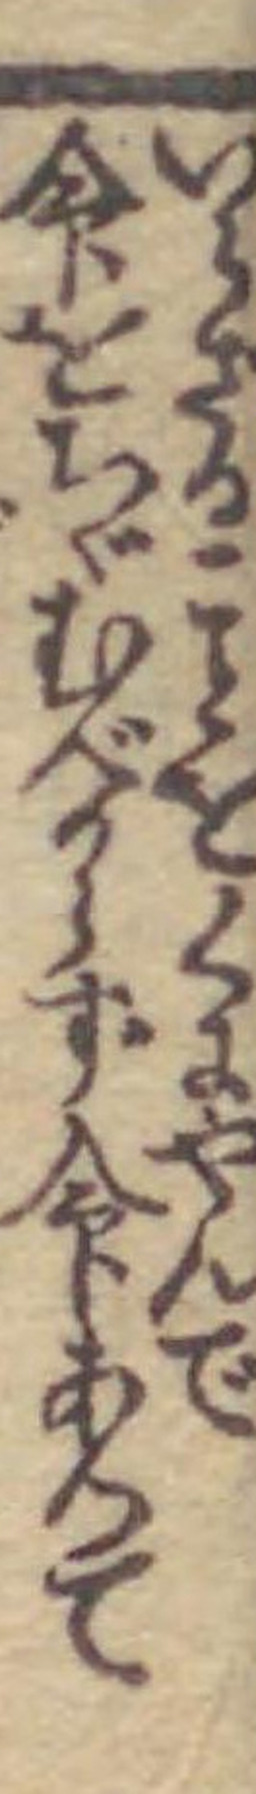命をちゞむべからず命あつて
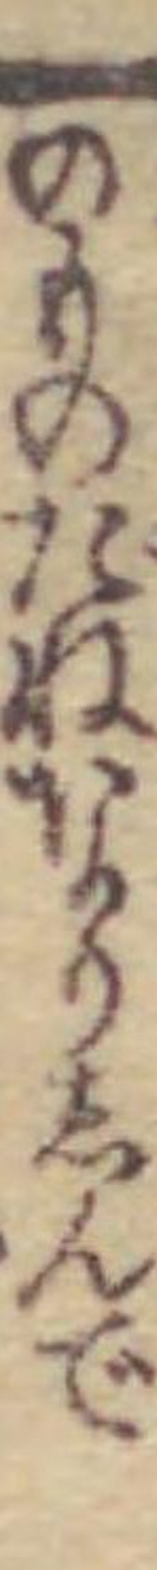のものだねなりしんで
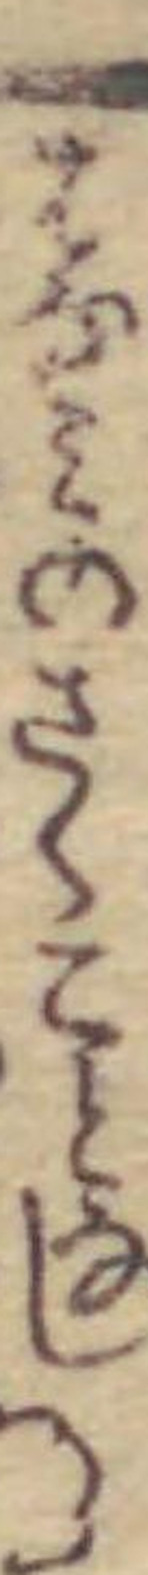はなみのさくことなし
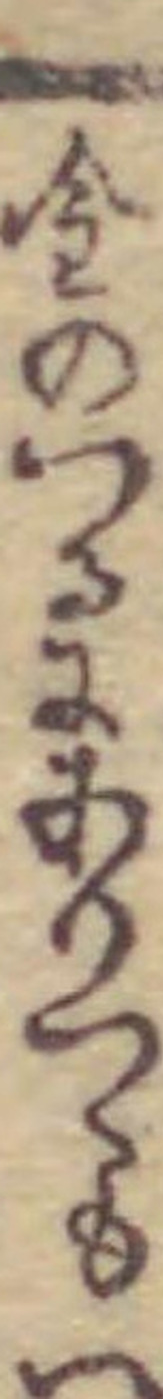金のつるにありつゝも
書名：御誂染長寿小紋 : 3巻
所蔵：国立国会図書館 National Diet Library, JAPAN
